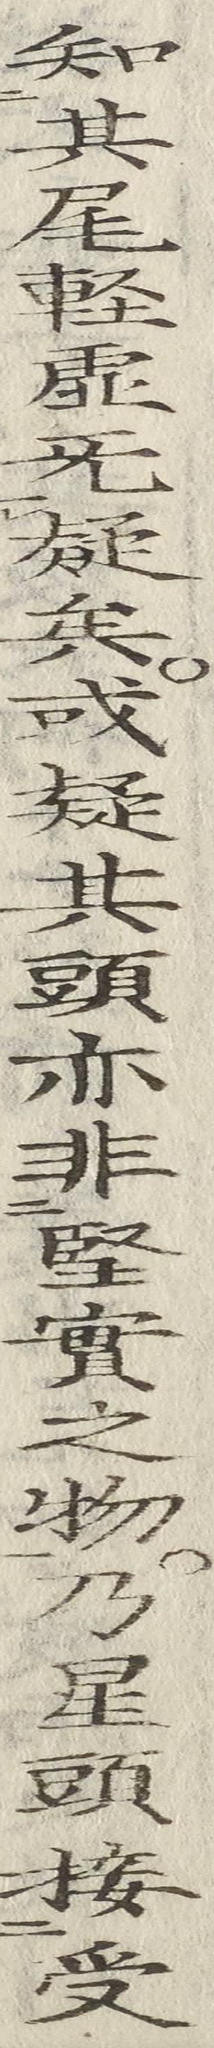知其尾軽虚无レ疑矣。或疑其頭亦非堅実之物。乃星頭接受
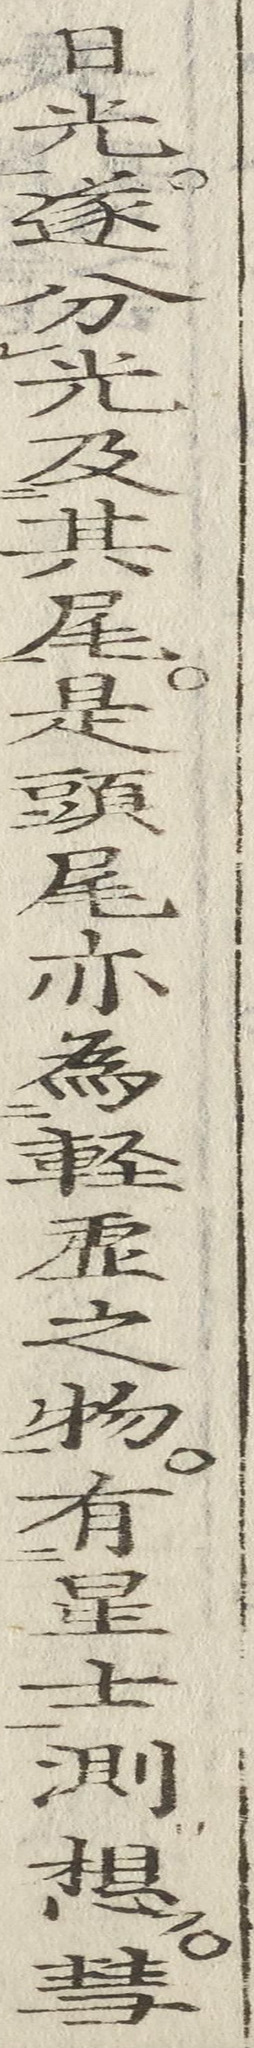日光。遂分光及其尾。是頭尾亦為軽虚之物。有星士測想。彗
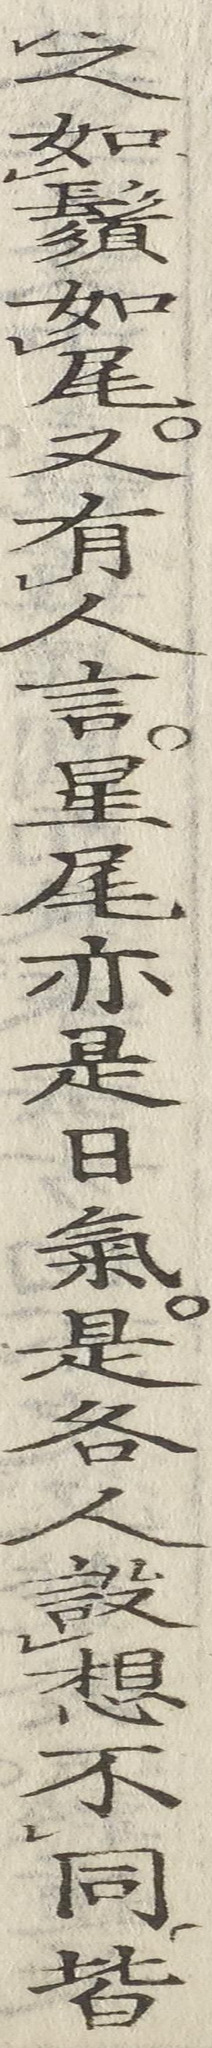之如鬚如尾。又有人言。星尾亦是日気。是各人設想不同。皆
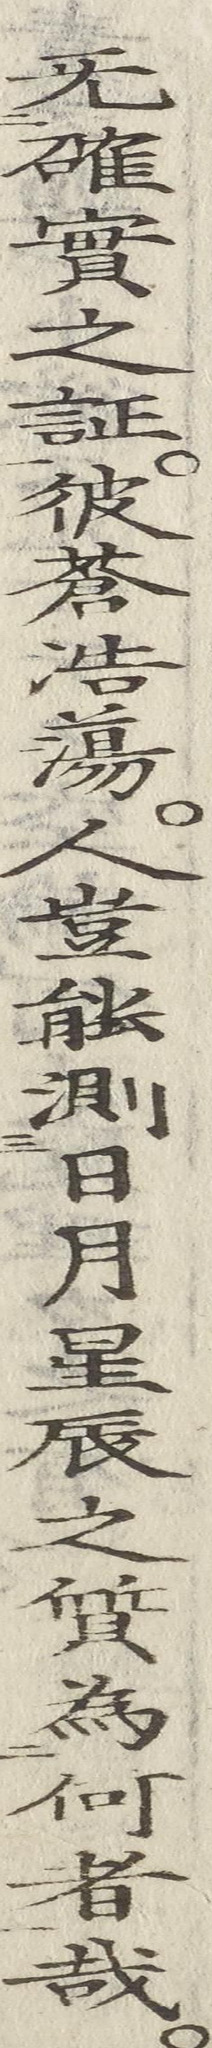无確実之証。彼蒼浩蕩。人豈能測日月星辰之質為何者哉。
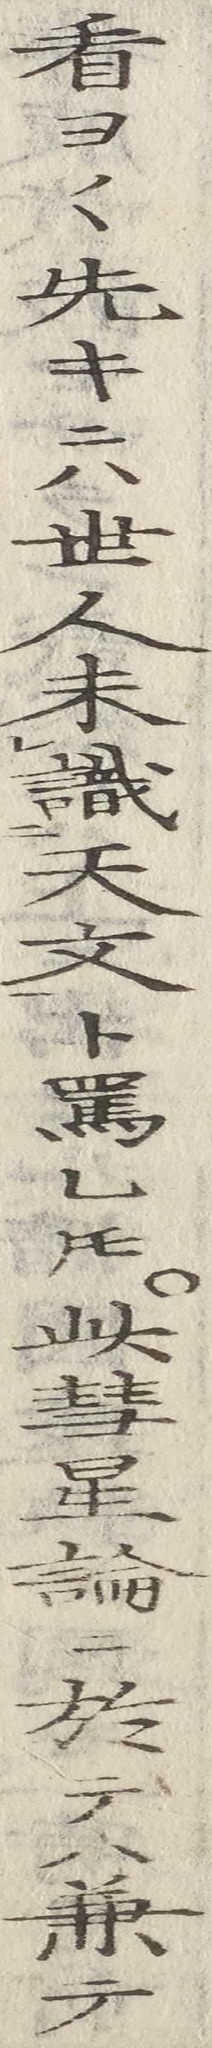看ヨ〳〵先キニハ世人未識天文ト罵レトモ。此彗星論ニ於テハ兼テ
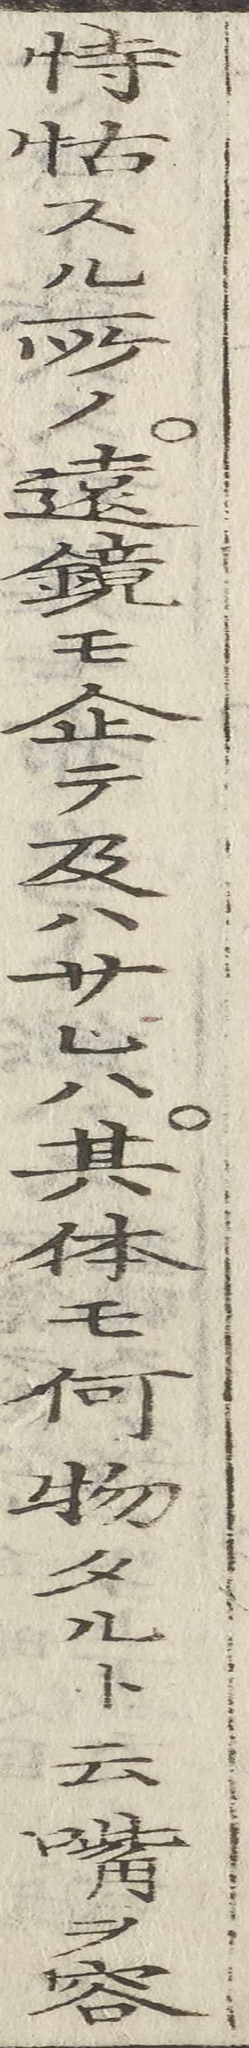恃怙スル所ノ。遠鏡モ企テ及ハサレハ。其体モ何物タルト云嘴ヲ容

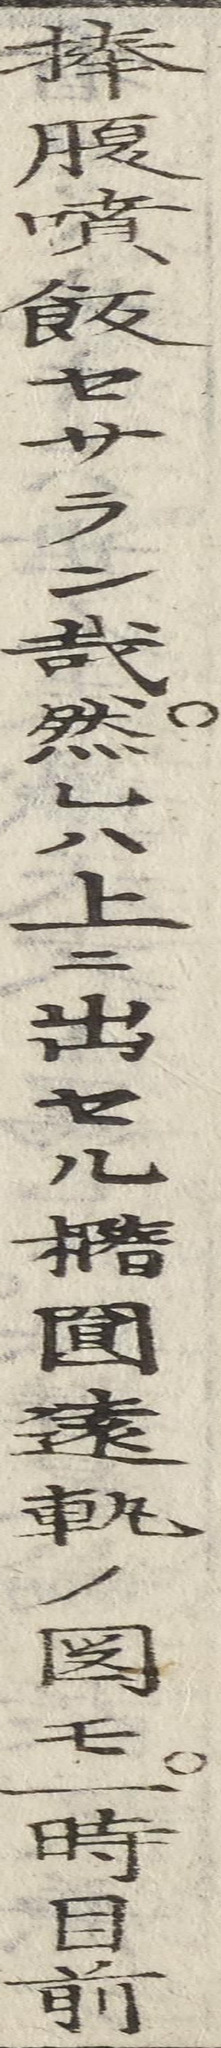捧腹噴飯セサラン哉。然レハ上ニ出セル橢円遠軌ノ図モ。一時目前
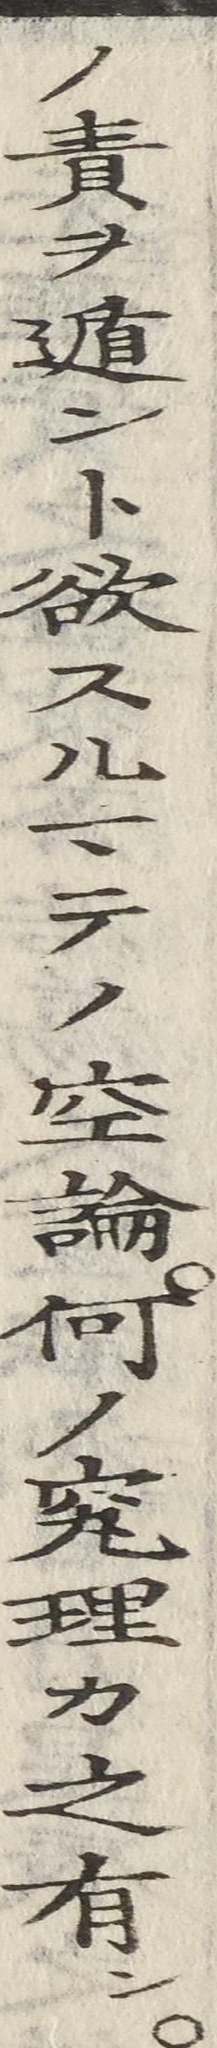ノ責ヲ遁ント欲スルマテノ空論。何ノ究理カ之有。
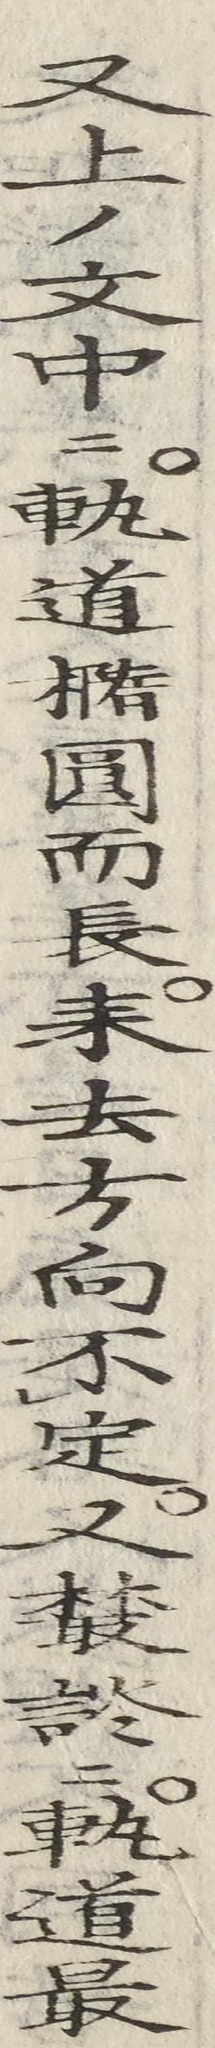又上ノ文中ニ。軌道橢円而長。来去方向不定。又樷談ニ。軌道最
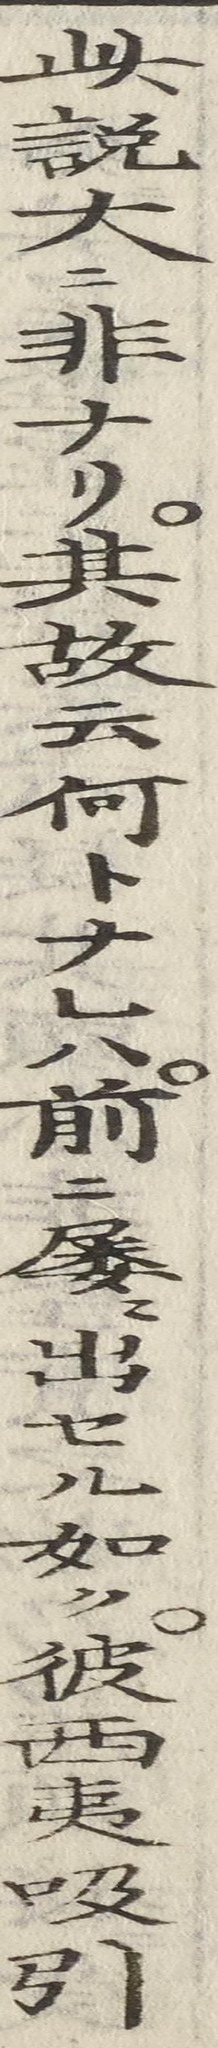此説大ニ非ナリ。其故云何トナレハ。前ニ屡々出セル如ク。彼西夷吸引
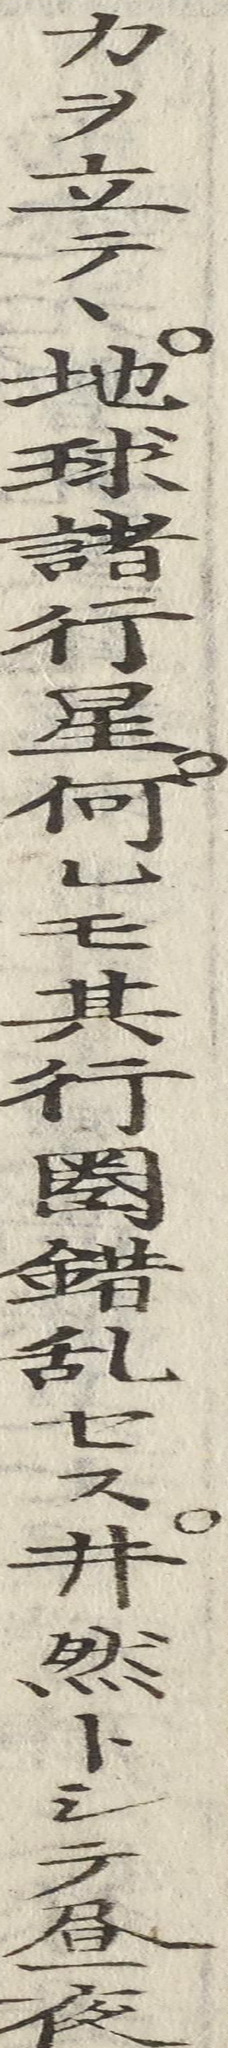カヲ立テヽ。地球諸行星。何レモ其行圏錯乱セス。井然トシテ昼夜
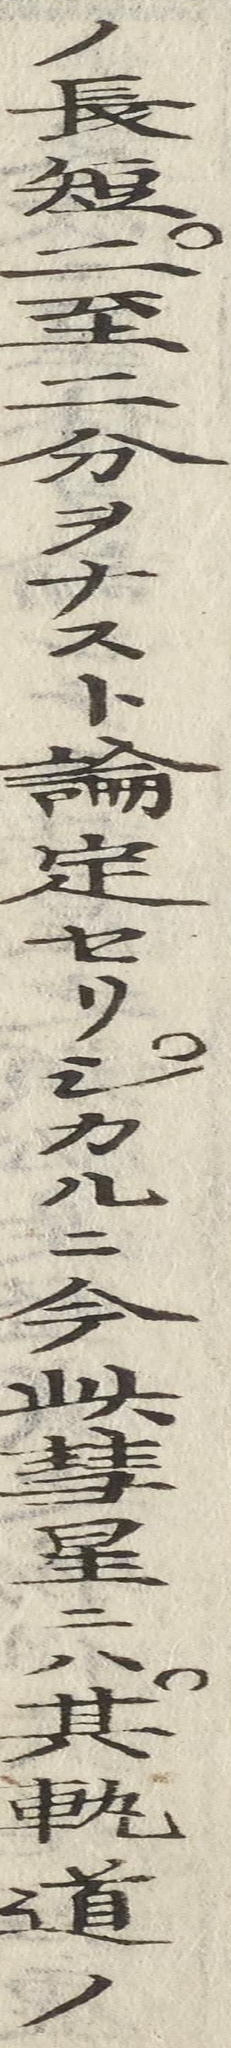ノ長短、二至ニ分ヲナスト論定セリ。シカルニ今此彗星ニハ。其軌道ノ
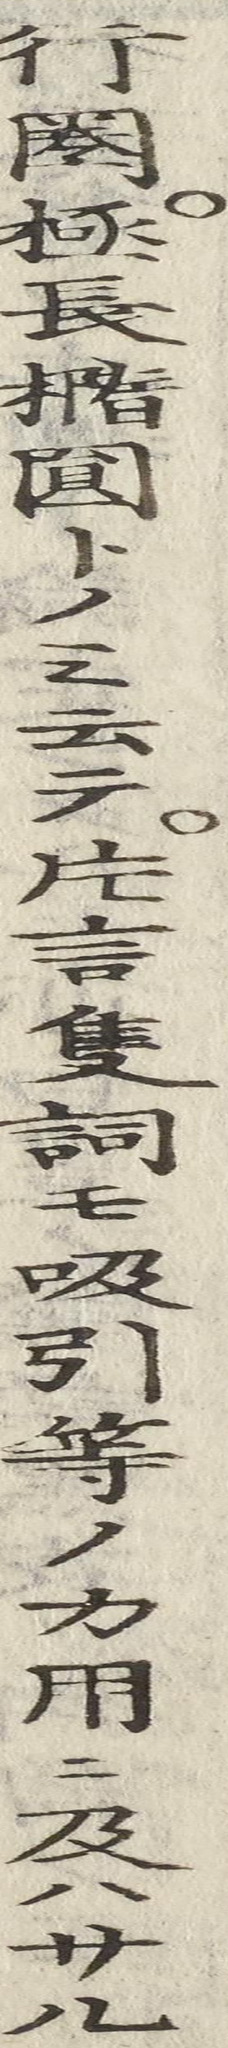行圏。極長橢円トノミ云テ。片言隻詞モ吸引等ノカ用ニ及ハサル
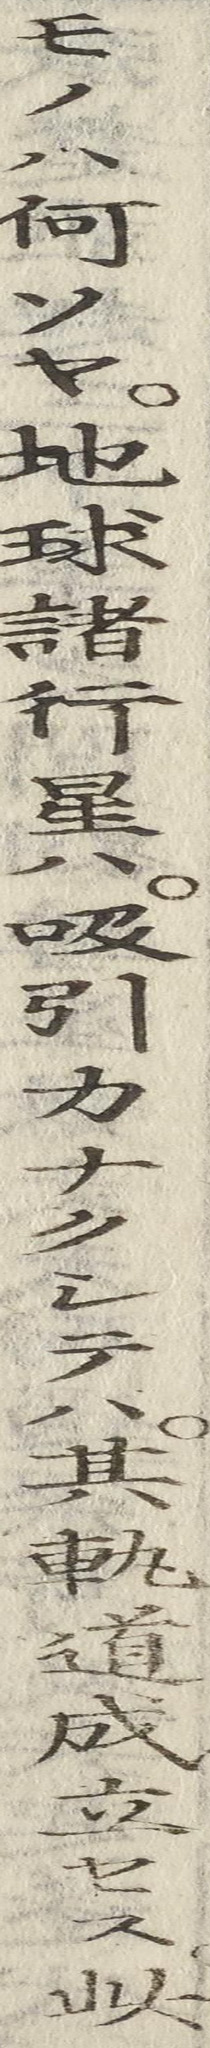モノハ何ソヤ。地球諸行星ハ。吸引カナクシテハ。其軌道成立セス。此
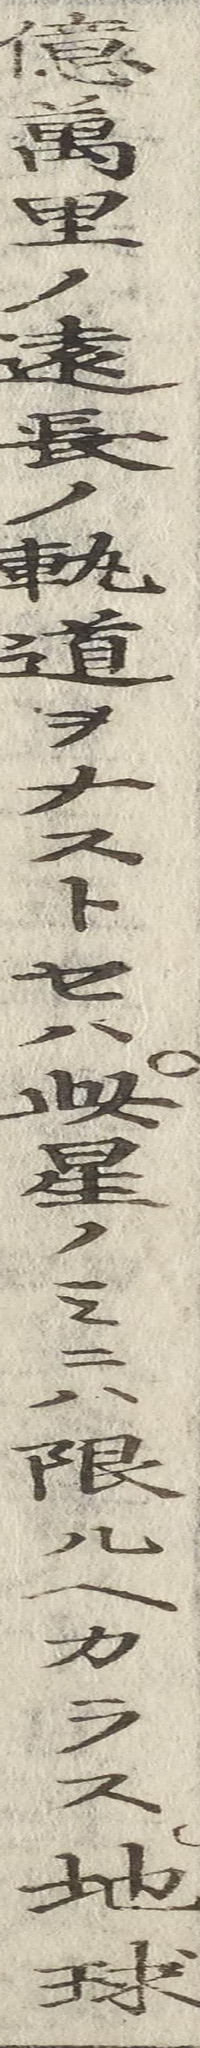億万里ノ遠長ノ軌道ヲナストセハ。此星ノミニハ限ルヘカラス。地球
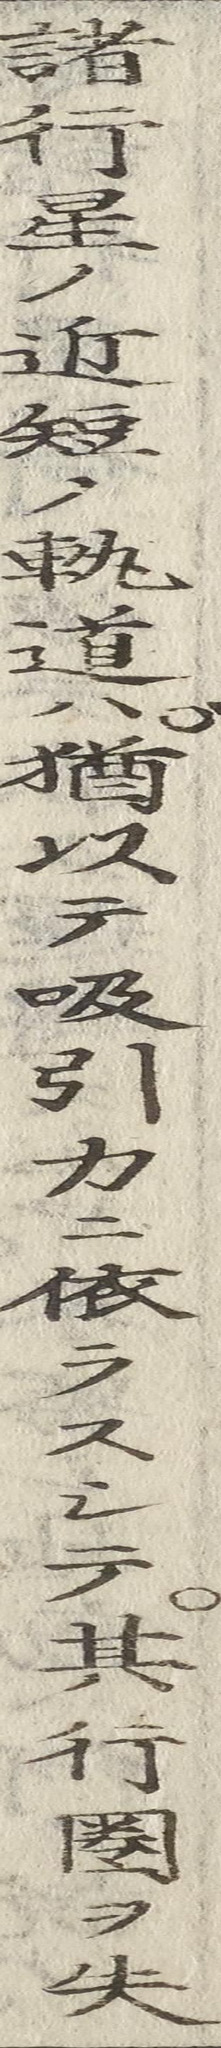諸行星ノ近短ノ軌道ハ。猶以テ吸引カニ依ラスシテ。其行圏ヲ失
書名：護法新論　中
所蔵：東京大学地震研究所図書室 Earthquake Research Institute Library, The University of Tokyo, JAPAN
